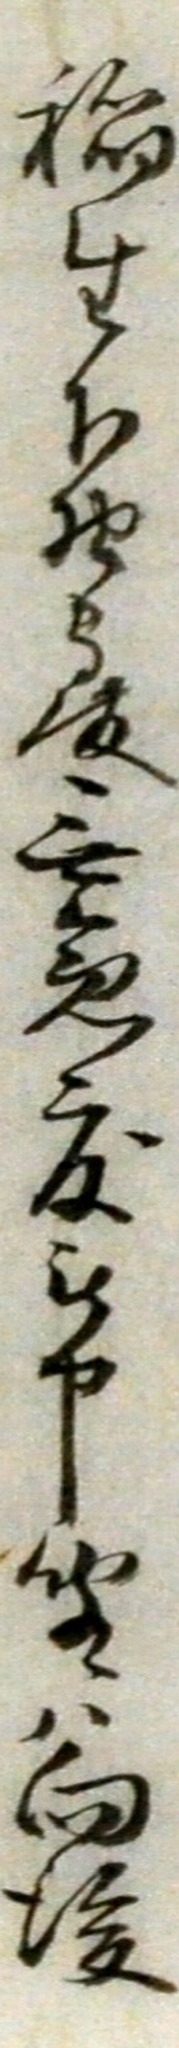稲生下野殿無急度被申聞候は向後
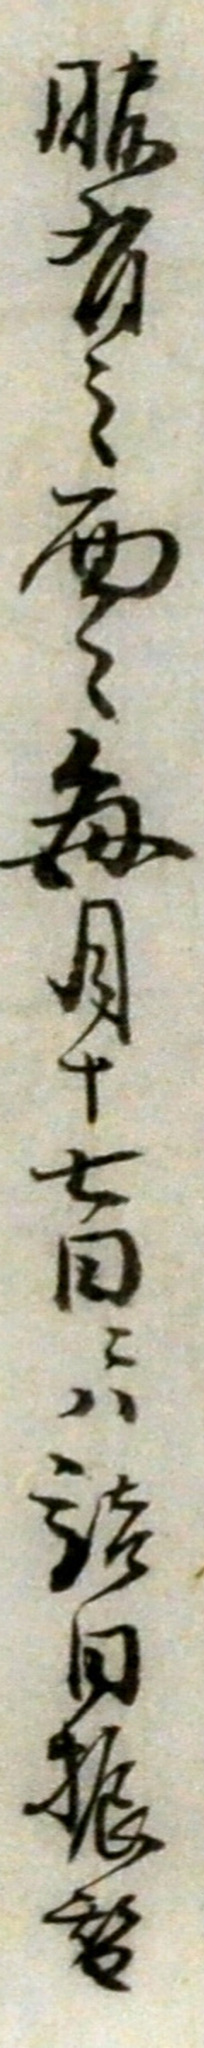服有之面々毎月十七日には詰日振替
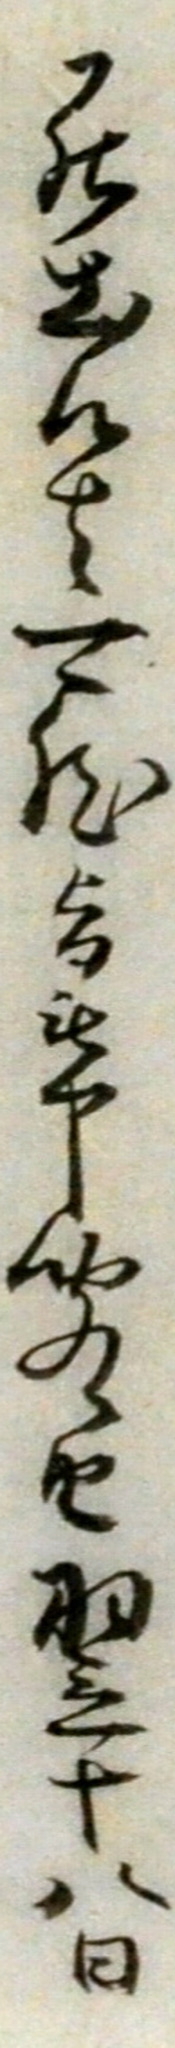罷出候は可然旨被申聞候由翌十八日
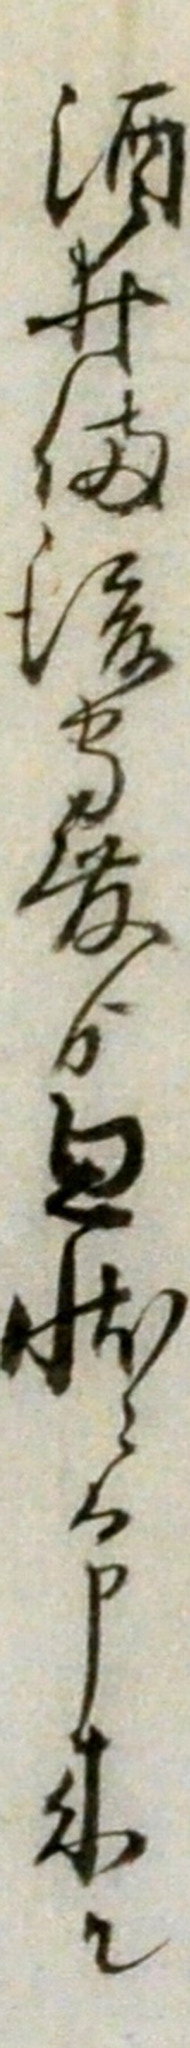酒井備後守殿ゟ廻状にて申来ル
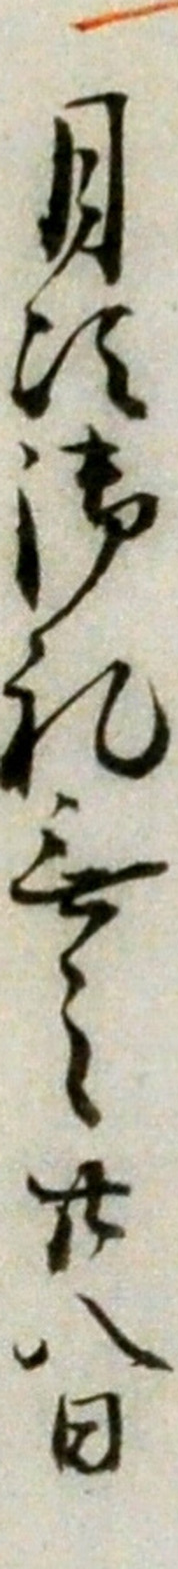月次御礼無之廿八日
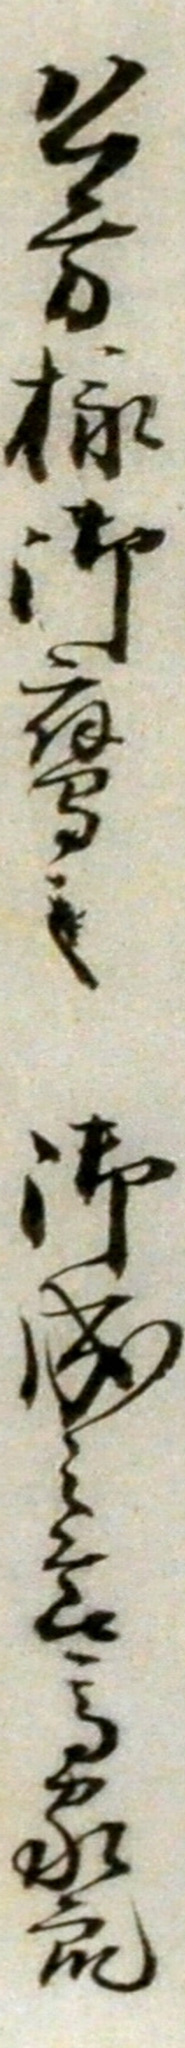公方様御鷹之御成之節高家衆
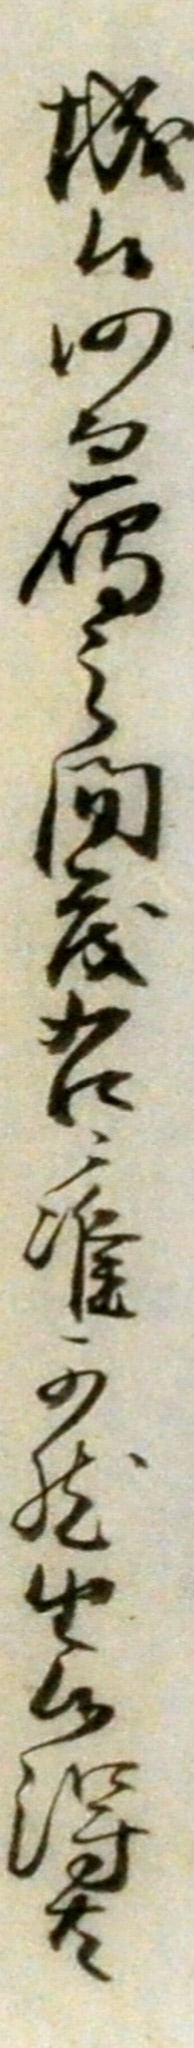城候仍て雁之間も右に准可然由候得共
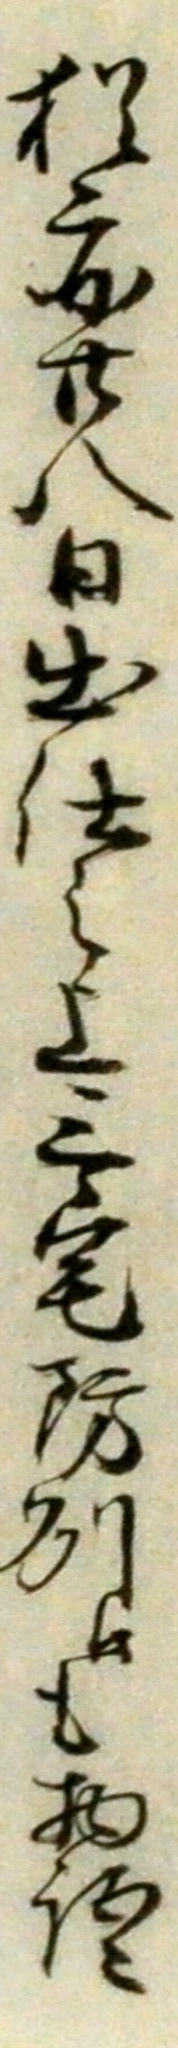猶亦廿八日出仕之上三宅防州えも物語
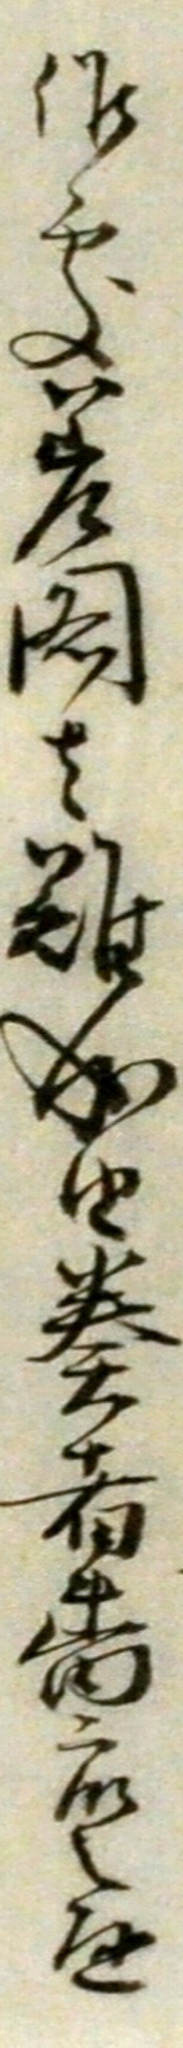候処差閣は難成由奏者番衆之通
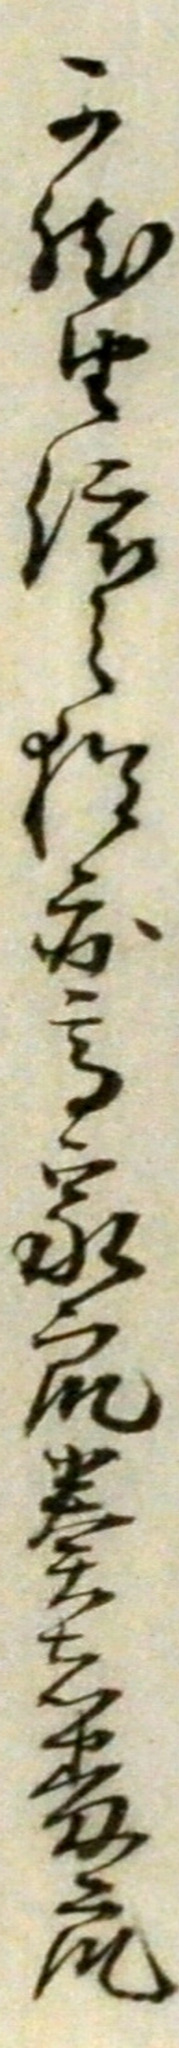可然由依之猶亦高家衆奏者番衆
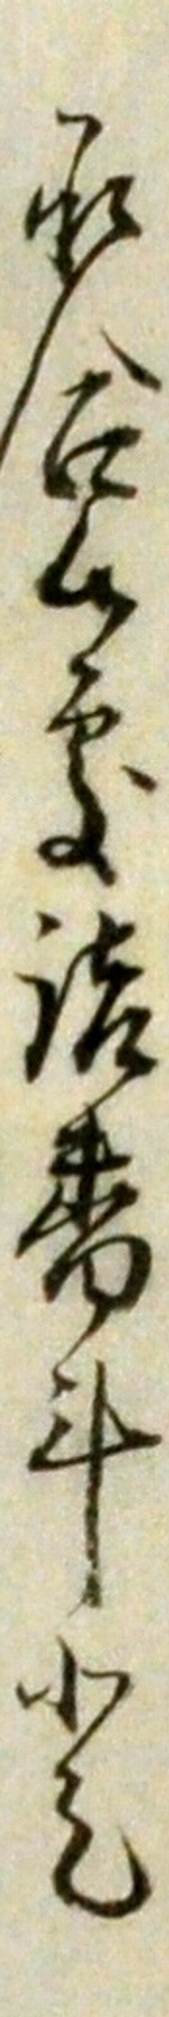承合候処詰番斗登
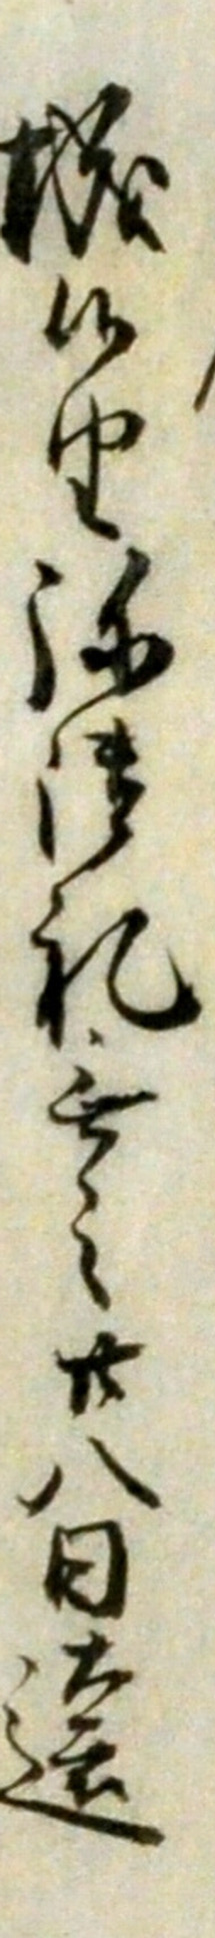城候由弥御礼無之廿八日遠
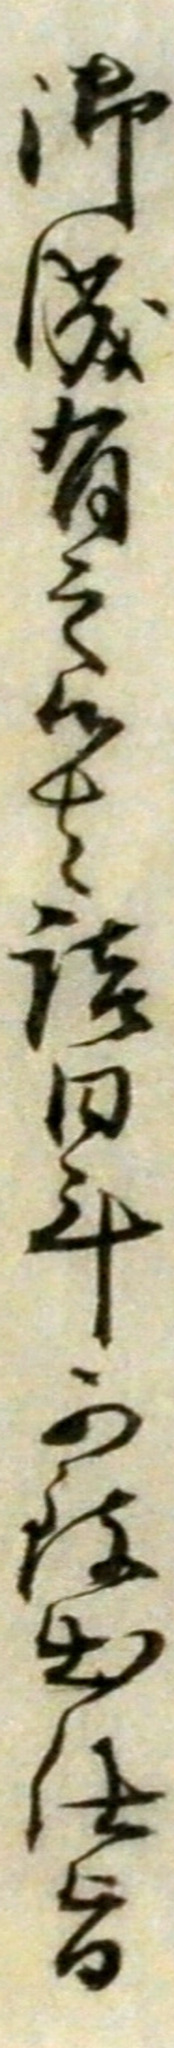御成有之候は詰日斗可致出仕旨
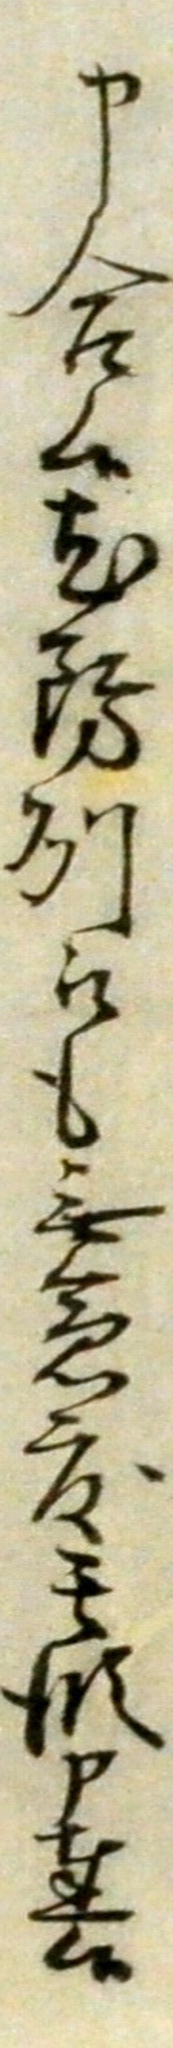申合候尤防州えも無急度其段申達候
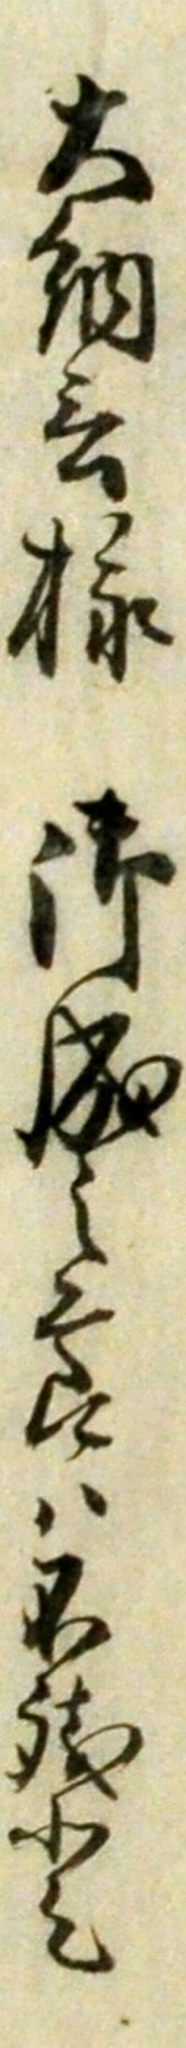大納言様御成之節は不残登
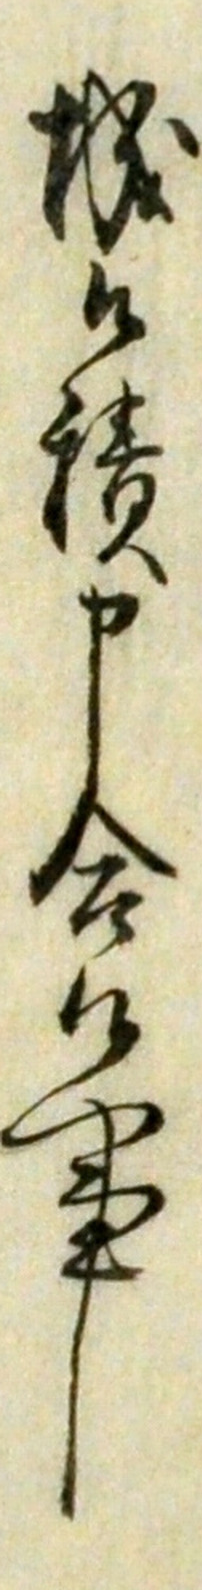城候積申合候事
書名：申合帳〔一括〕
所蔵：伊那市立高遠町図書館・合同会社AMANE
